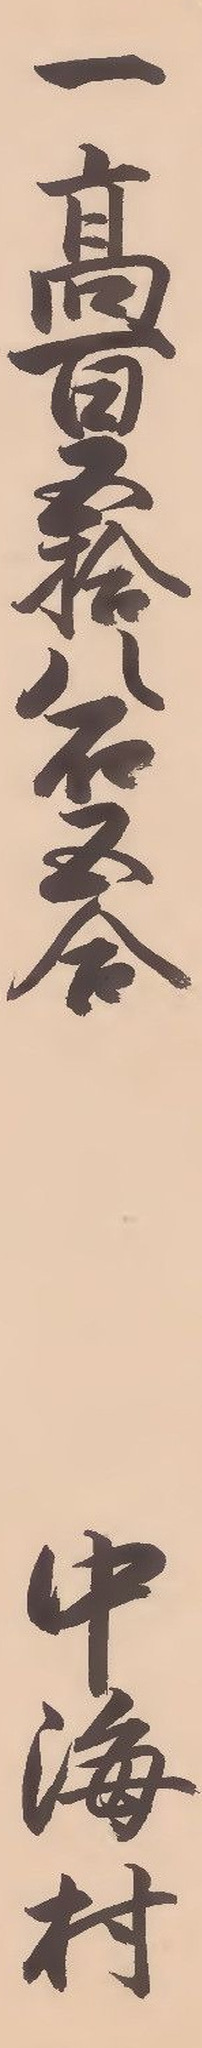一高百五拾八石五合中海村
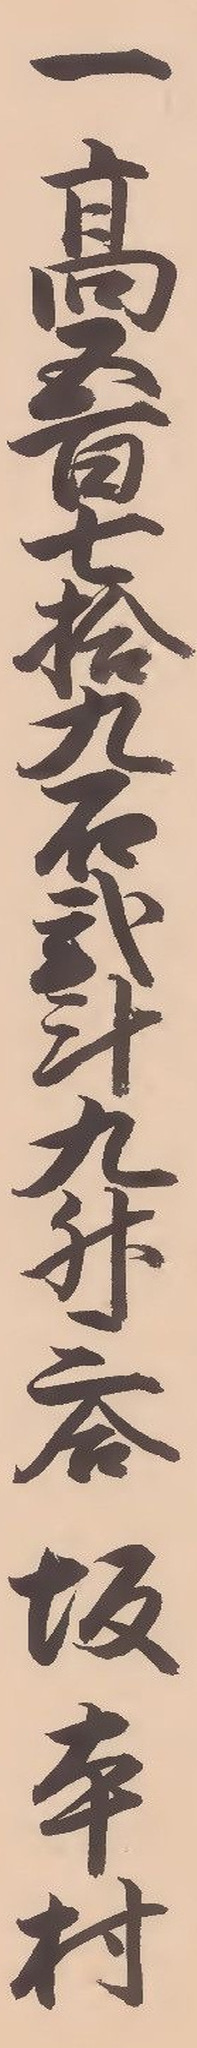一高五百七拾九石弐斗九升三合坂本村
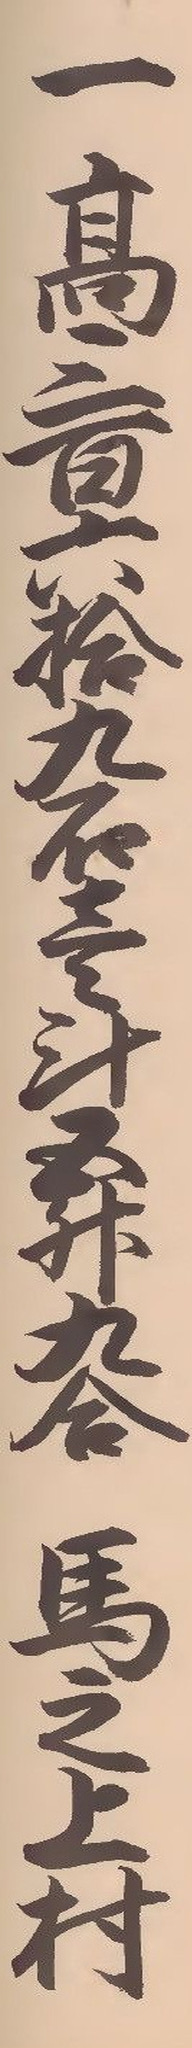一高三百六拾九石壱斗五升九合馬之上村

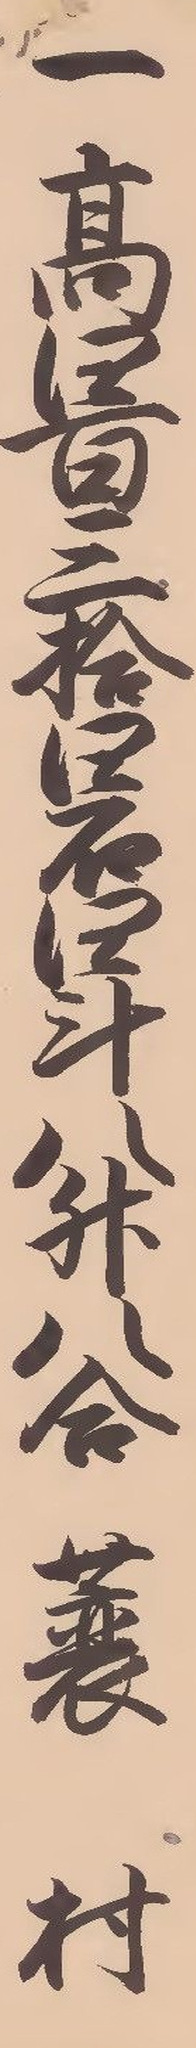一高四百三拾四石四斗八升八合簑村
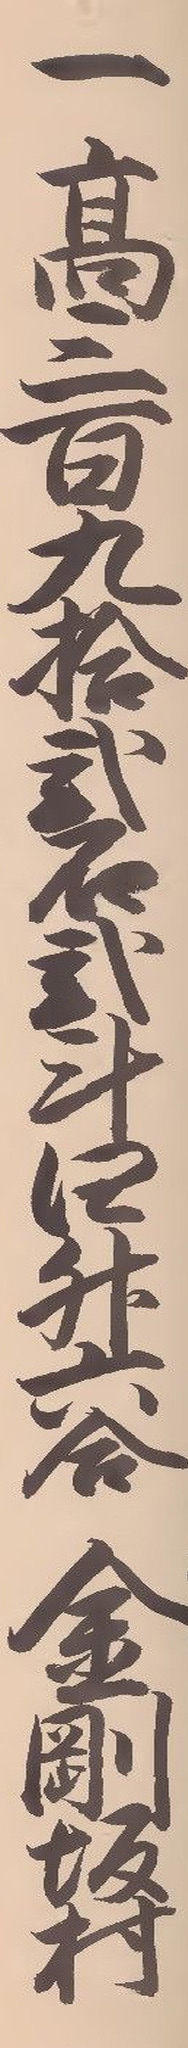一高千百九拾三石三斗四升弐合上村
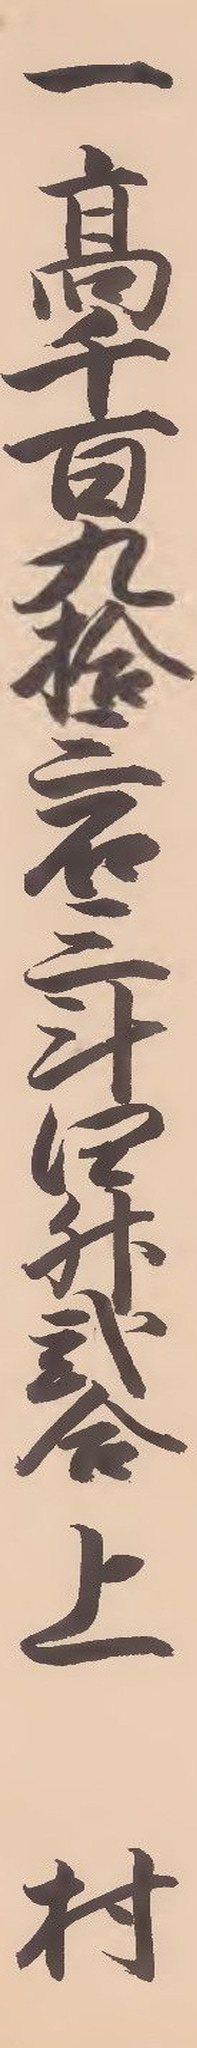一高千百九拾三石三斗四升弐合上村
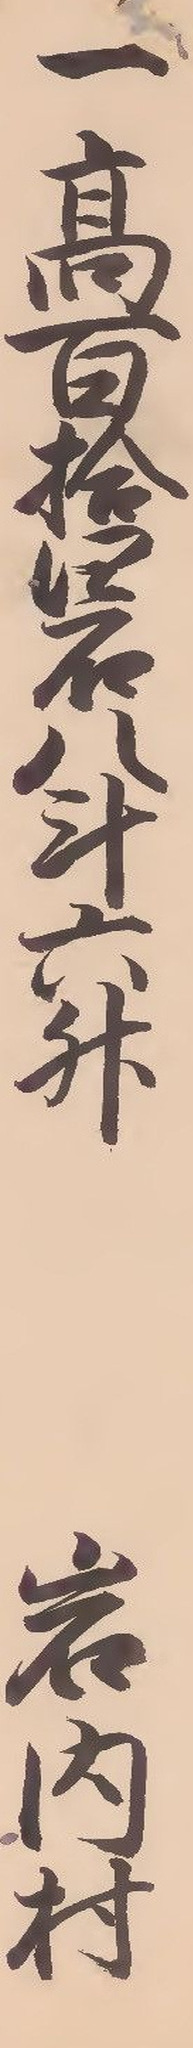一高百拾四石八斗六升岩内村

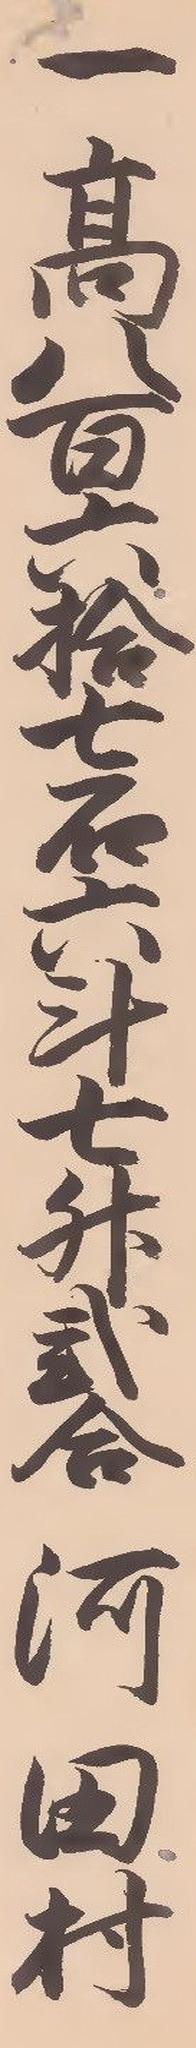一高八百六拾七石六斗七升弐合河田村
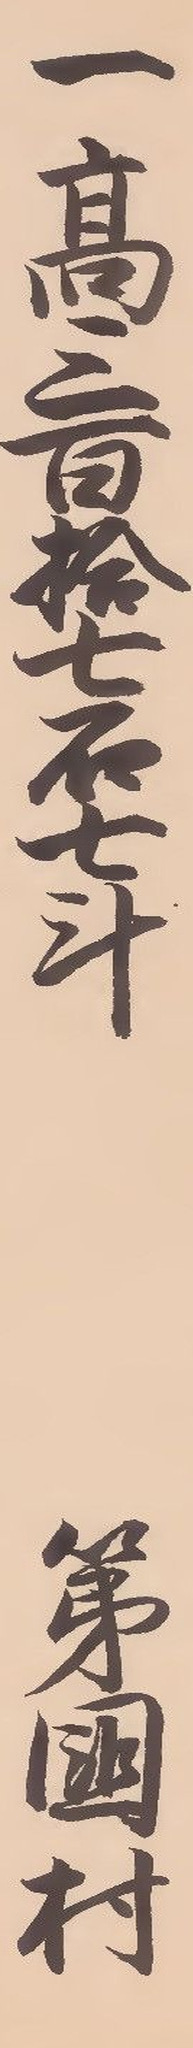一高三百拾七石七斗弟国村
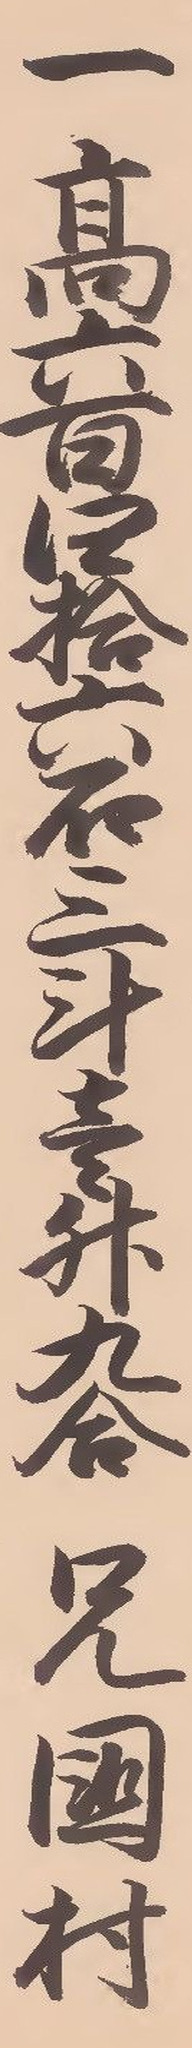一高六百四拾六石三斗壱升九合兄国村
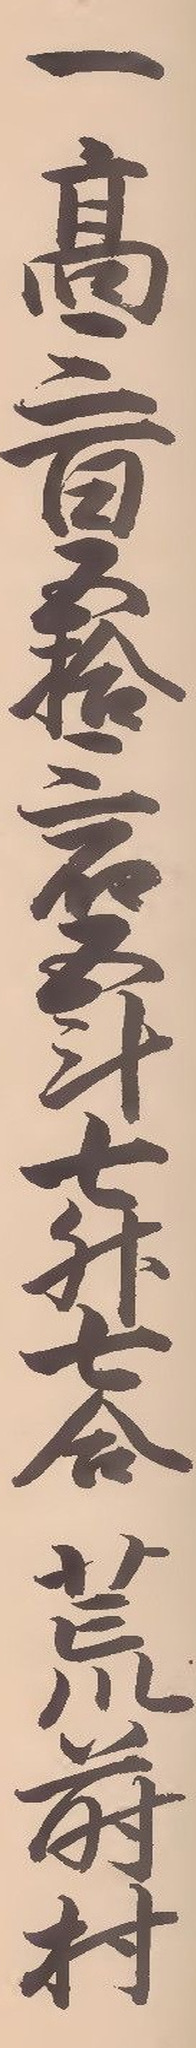一高三百五拾三石五斗七升七合荒蒔村
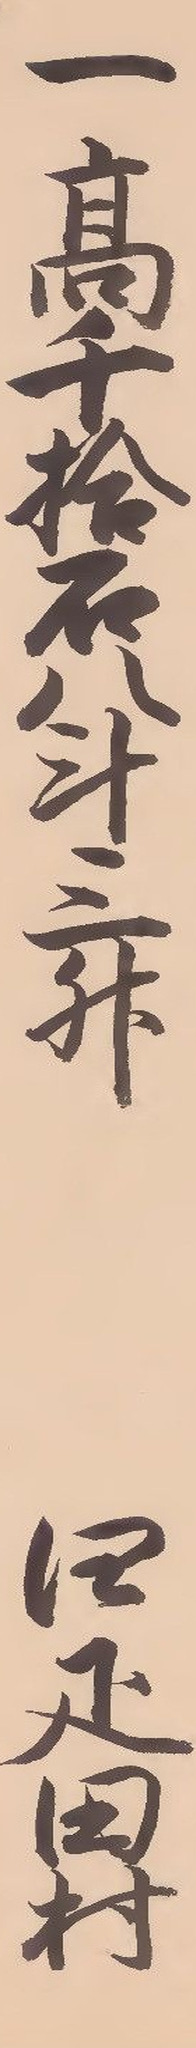一高千拾石八斗三升四疋田村
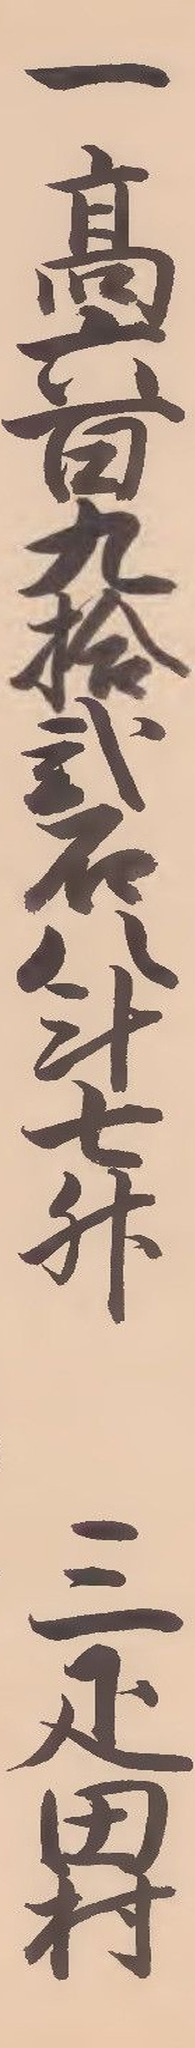一高六百九拾弐石八斗七升三疋田村

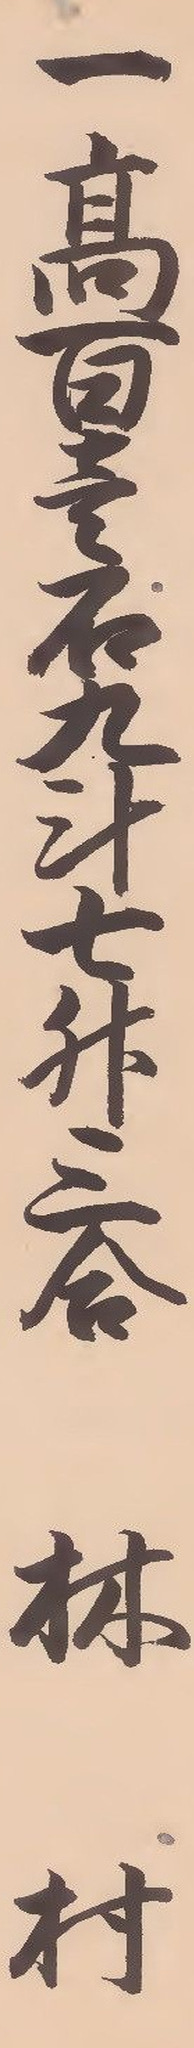一高百壱石九斗七升三合林村
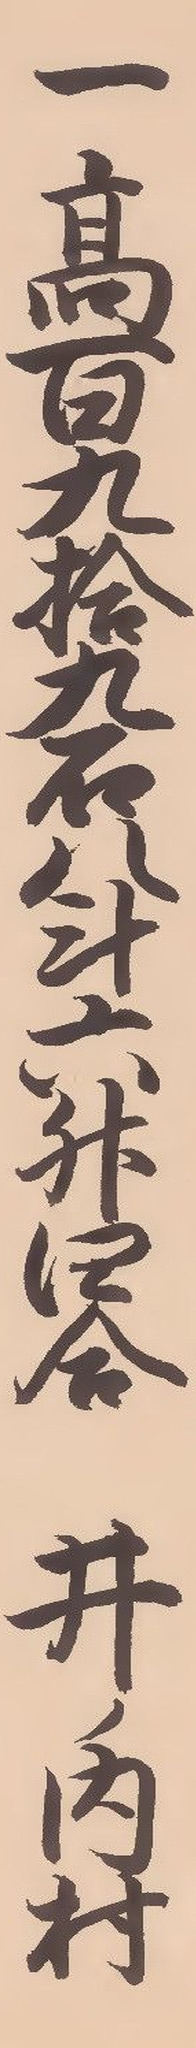一高百九拾九石八斗六升四合井ノ内村
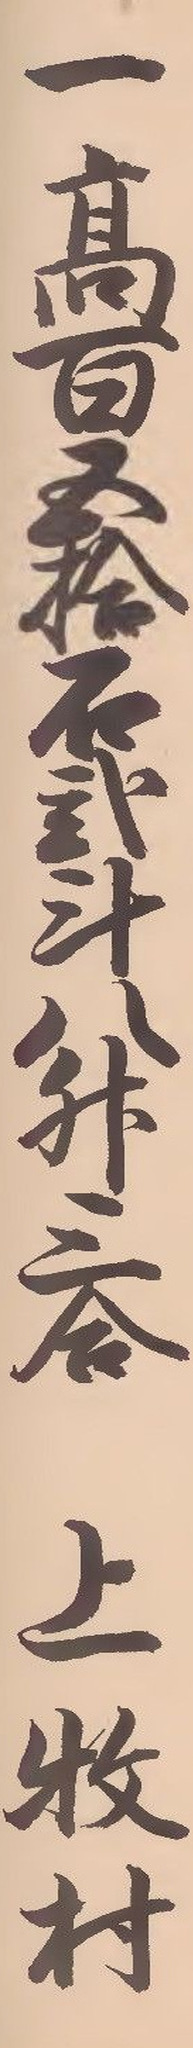一高百五拾石弐斗八升三合上枚村
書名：伊勢国郷帳
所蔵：国立公文書館 National Archives of Japan
